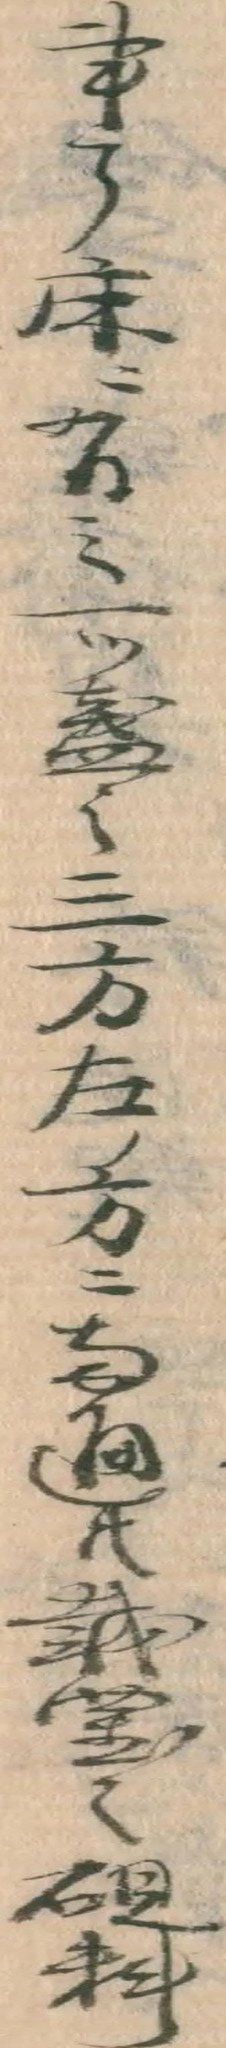事了床ニ有之一ツ盞之三方左ノ方ニ両通共載置之硯料
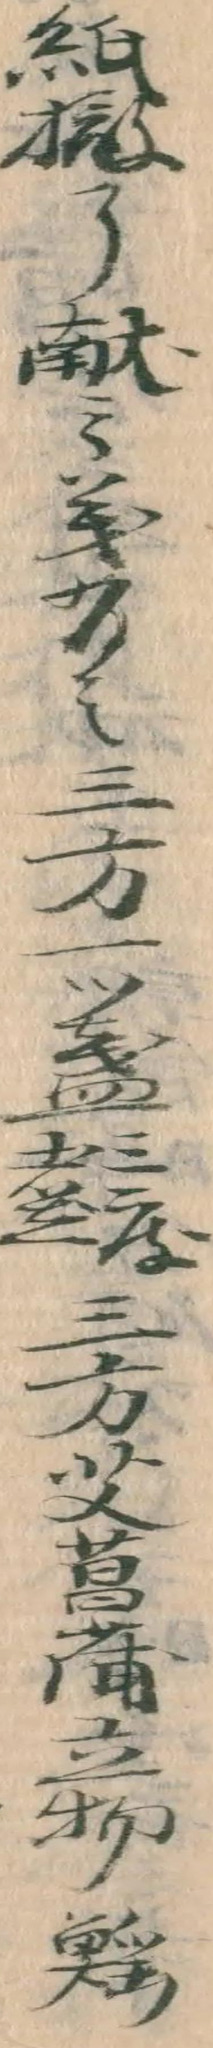紙撒了献候義有之三方一ツ盞三度土器三方艾菖蒲立物鰩
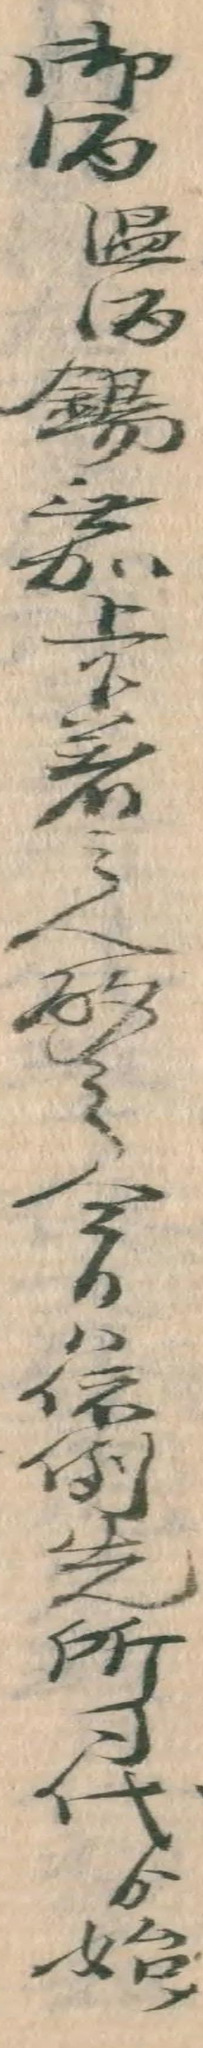御酒温酒錫無加上下着之人形之今日ハ依例先所司代ゟ始メ
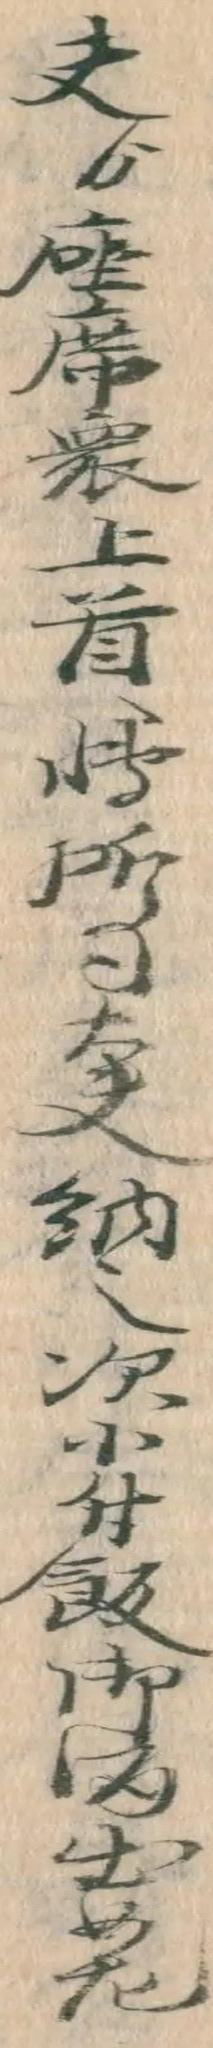夫ゟ座席衆上首へ轉所司大夫納之次小付飯御酒出如左
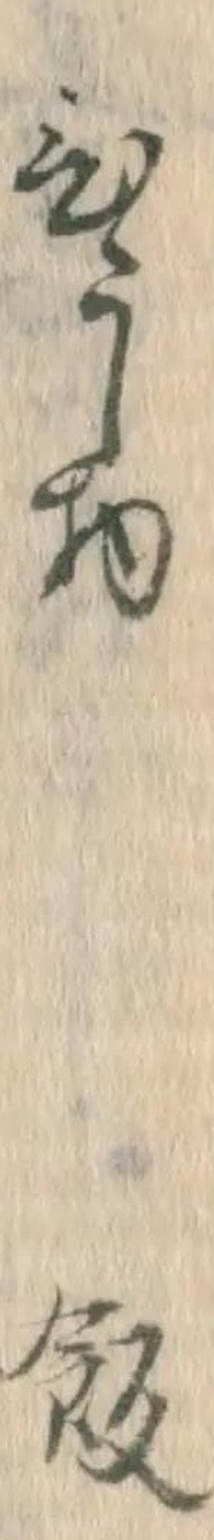ひたし物飯
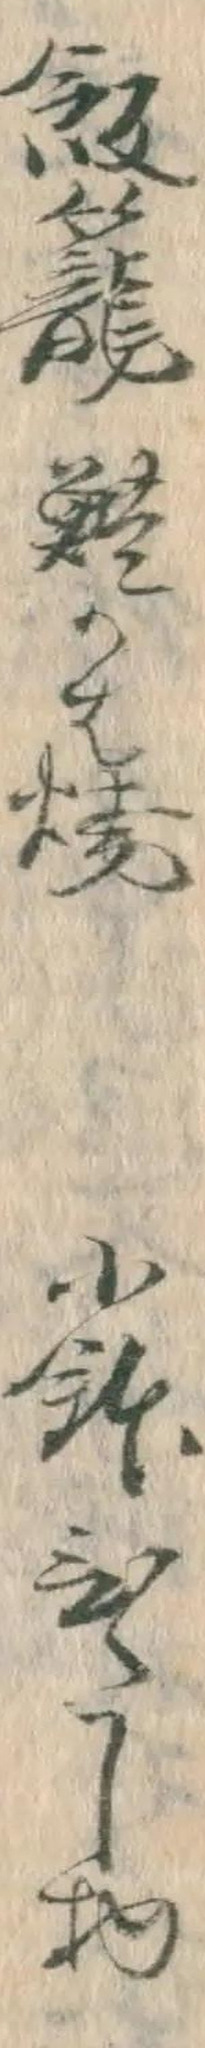飯籠鱧かは焼小鉢ひたし物
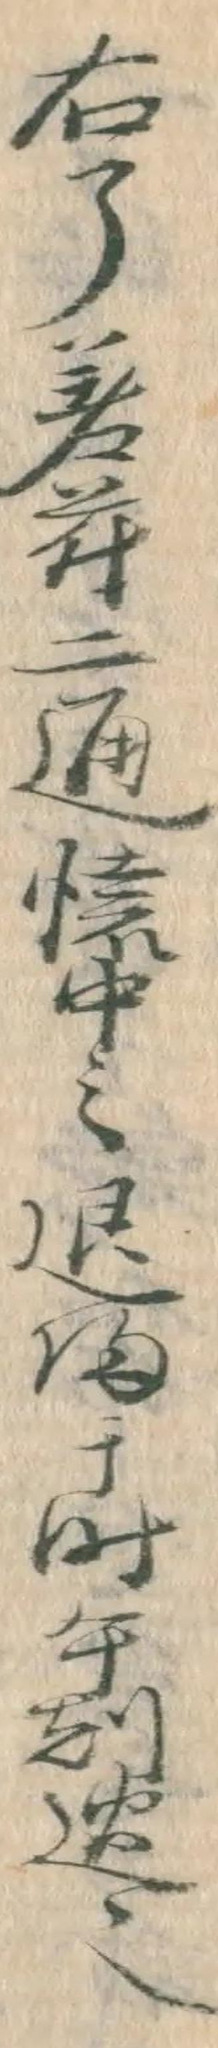右了差符二通懐中之退帰于時午刻過也
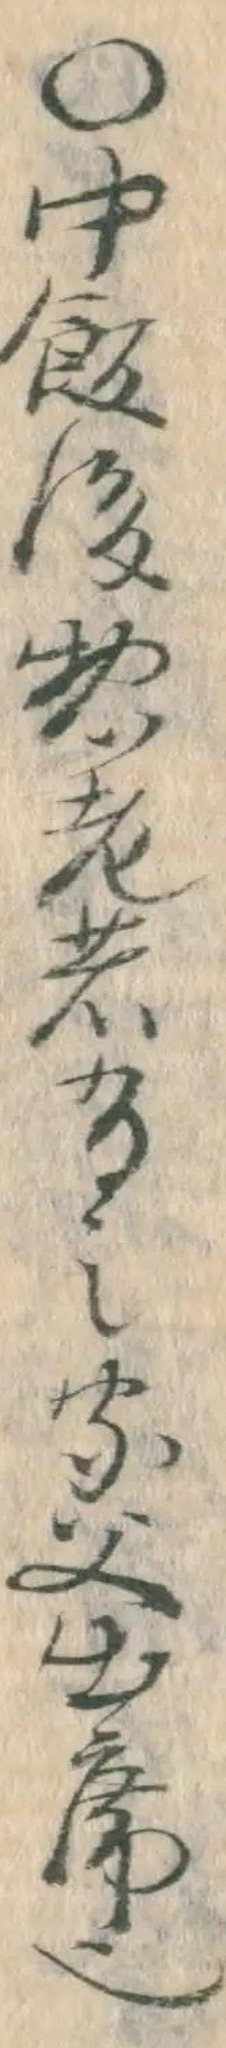○中飯後惣老者有之家父出席也
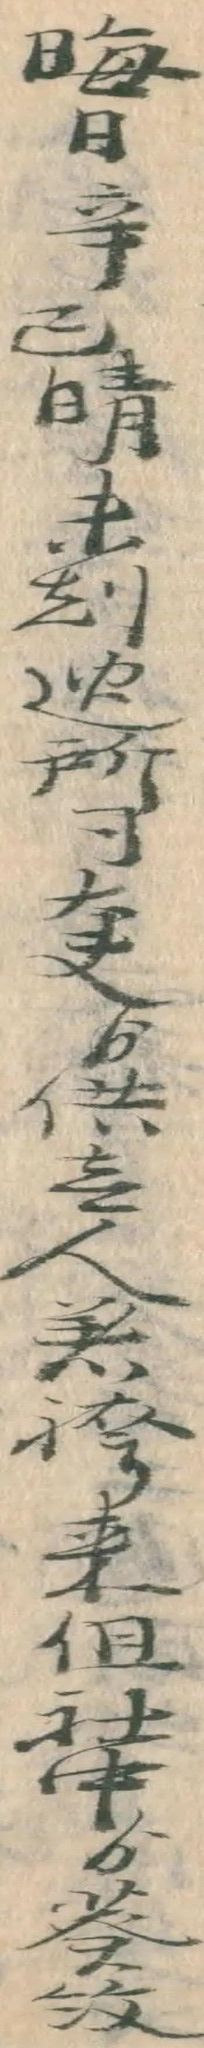晦日辛巳晴未刻過所司大夫ゟ供壱人着袴来但社中ゟ葵紋
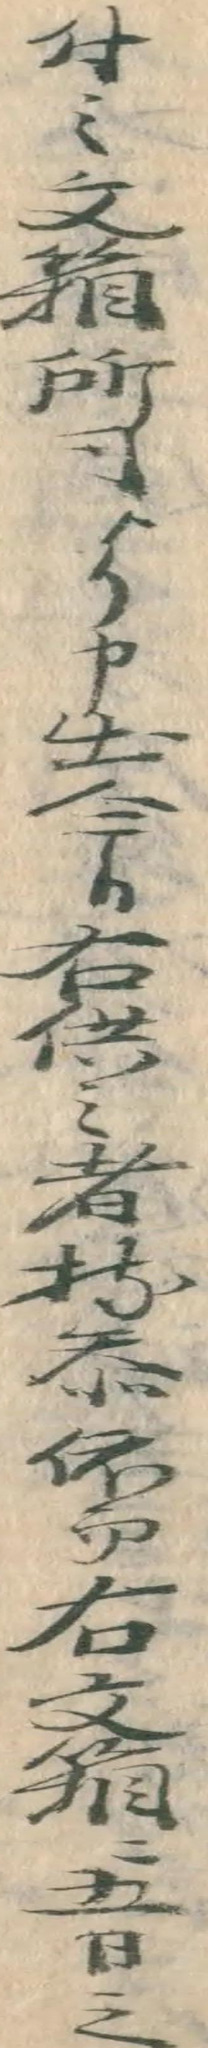付之文箱所司より申出今日右供之者持参依而右文箱に五日之
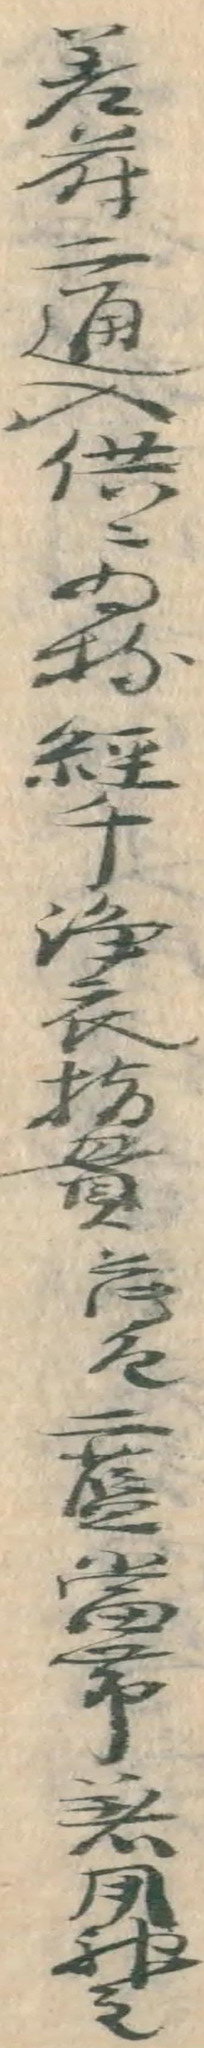差符二通入供ニ為持経千浄衣指貫薄色二藍當帯着用神主

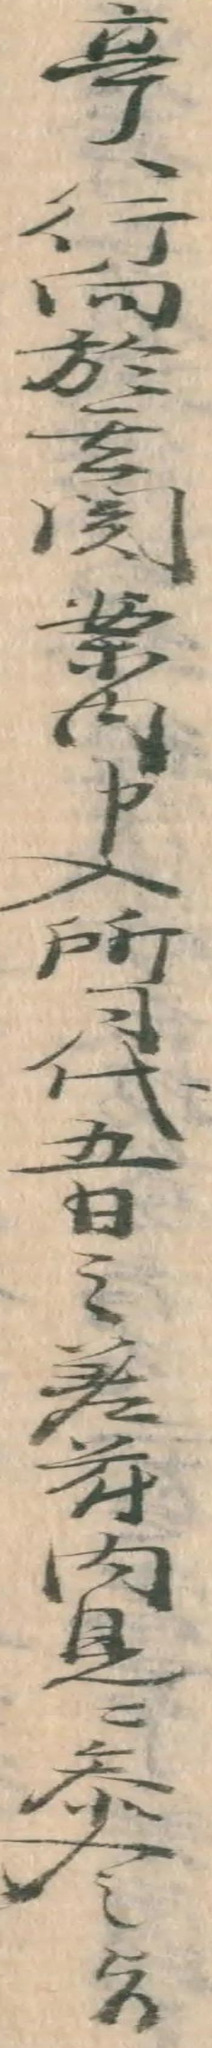亭へ行向於玄関案内申入所司代五日之差符内見ニ参入之旨
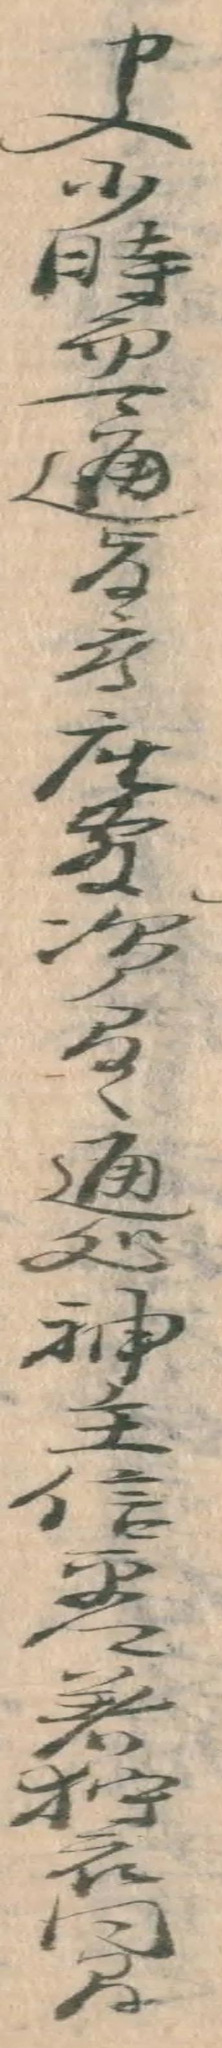申入少時勤可通旨ニ付座敷次ノ間へ通処神主信平卿着狩衣同間
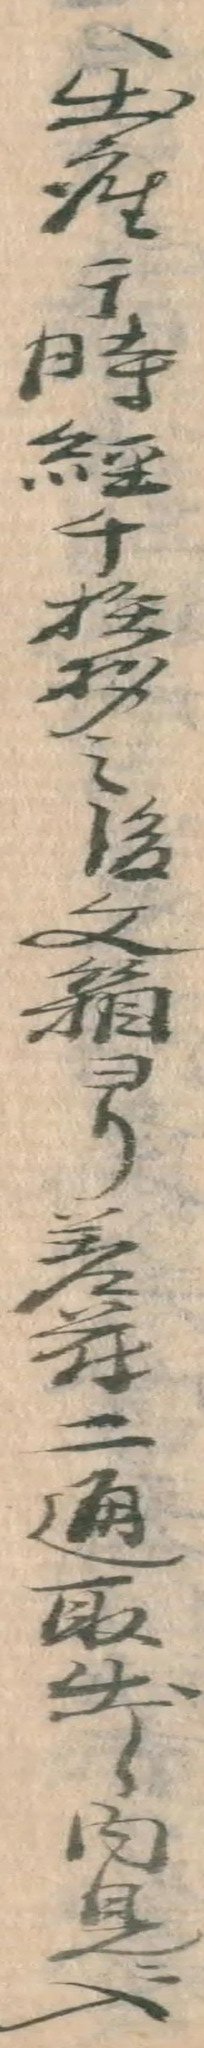へ出座于時経千挨拶之後文箱ヨリ差符二通取出し内見ニ入
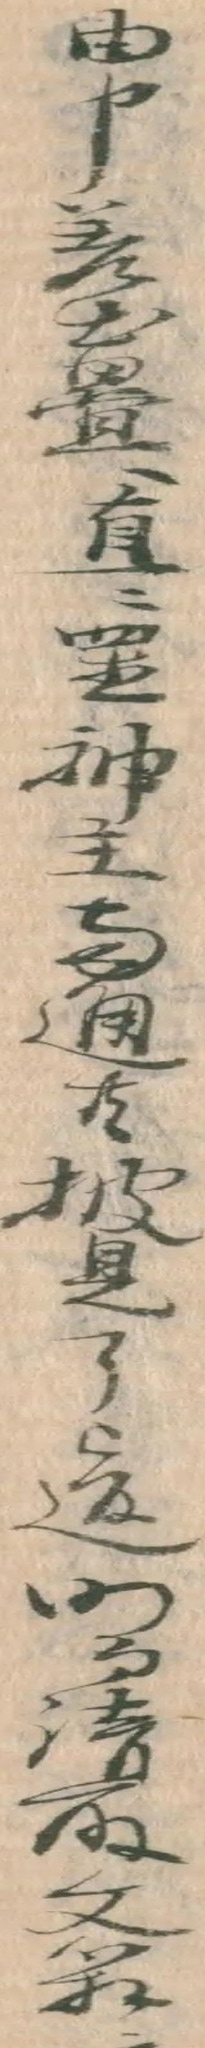由申差出畳へ直ニ置神主両通共披見了被返仍而請取文箱ニ
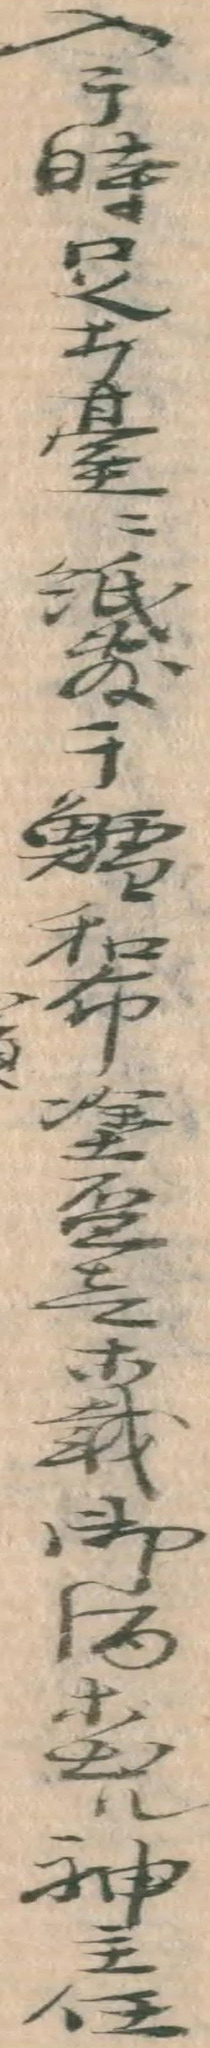入于時足土䑓ニ紙敷干鱈和布塗盃壱等載御酒等出ル神主任
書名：賀茂社記録. 第65冊
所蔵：国立国会図書館 National Diet Library, JAPAN
